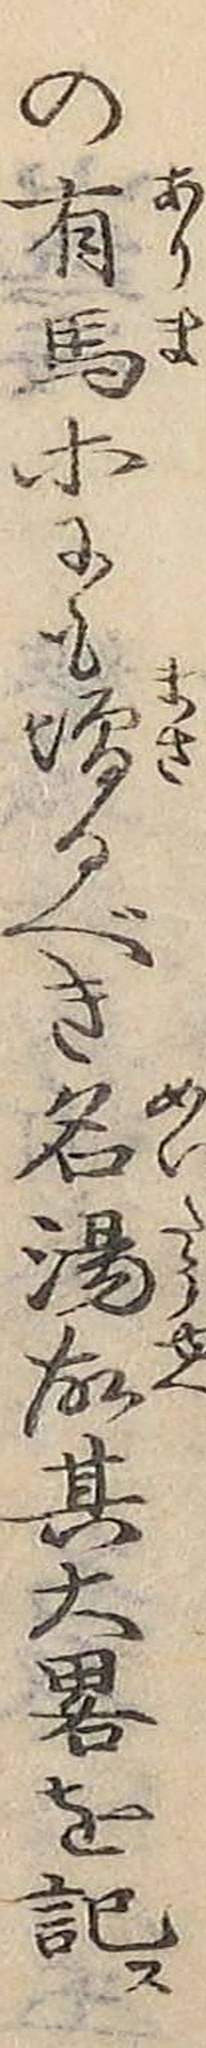の有馬等にも増るべき名湯故其大略を記

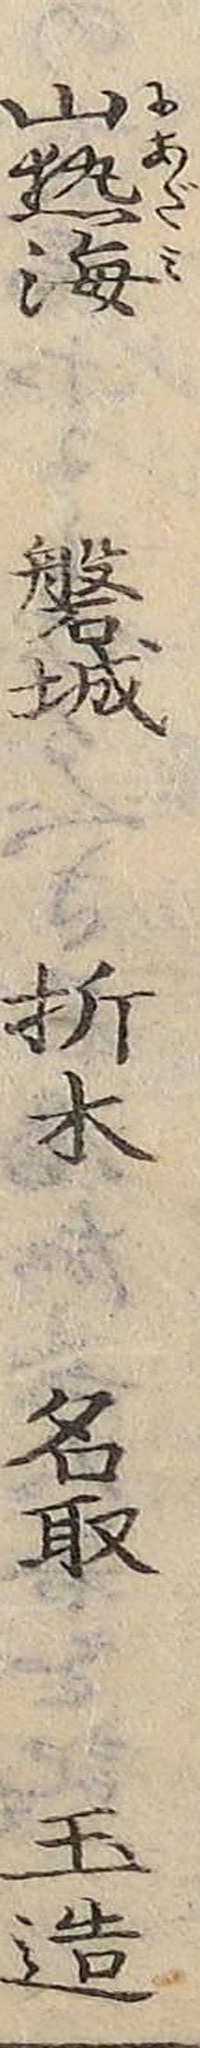山熱海磐城折木名取玉造
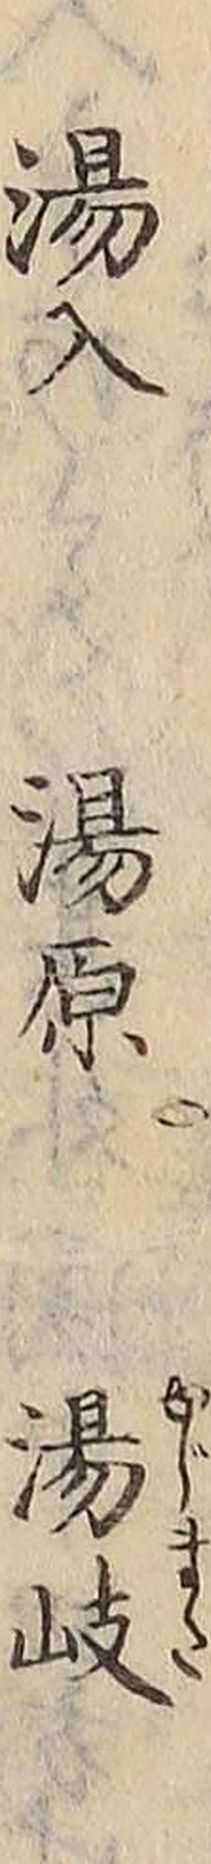湯入湯原湯岐
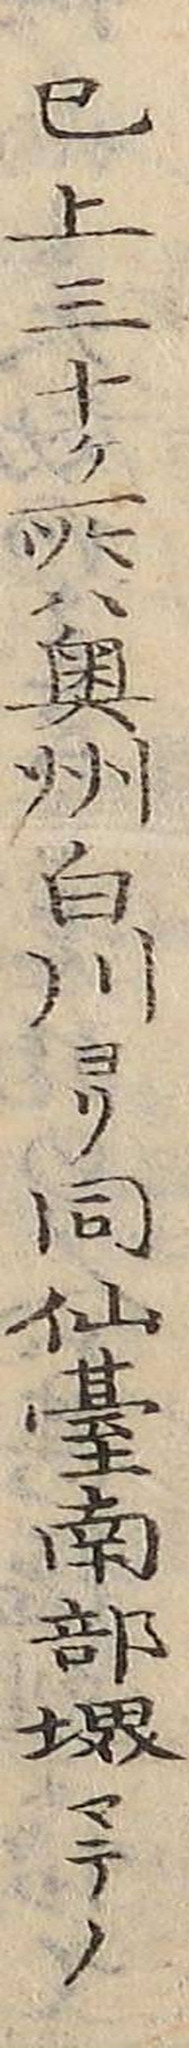巳上三十ケ所は奥州白川ヨリ同仙䑓南部堺マテノ
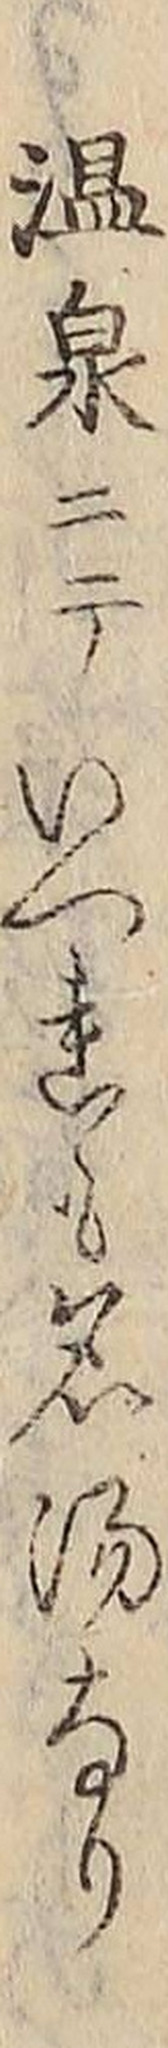温泉ニテいつれも名湯なり
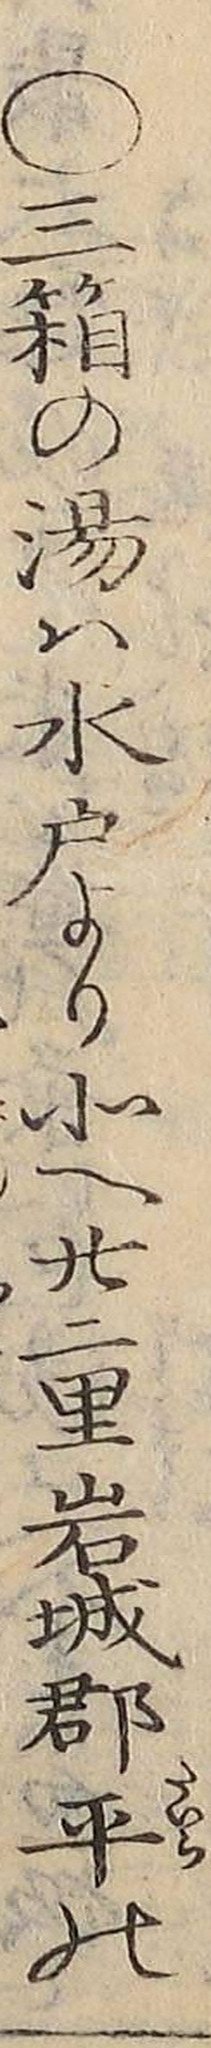○三箱の湯は水戸より北へ廿二里岩城郡平の
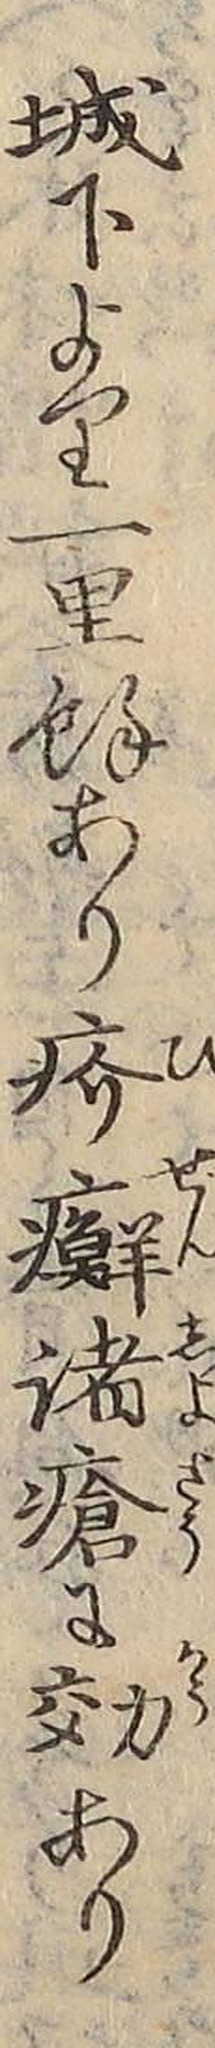城下より一里余あり疥癬諸瘡に効あり
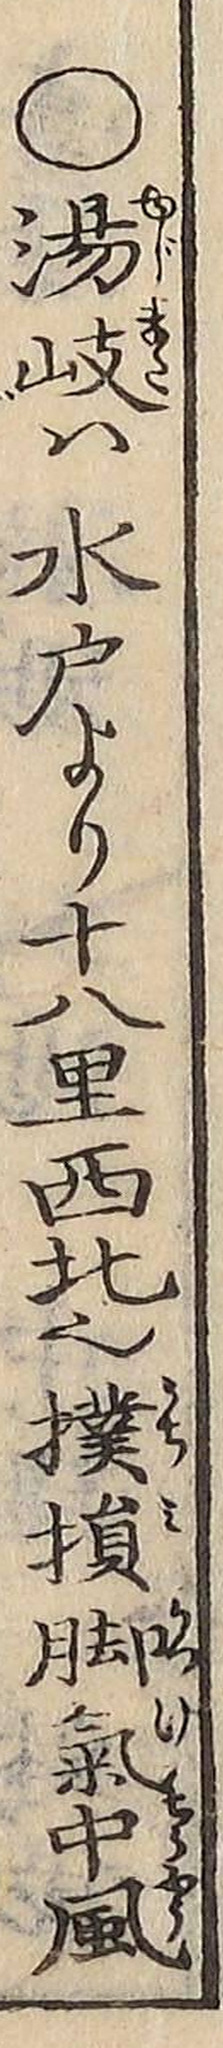○湯岐は水戸より十八里西北也撲損脚気中風
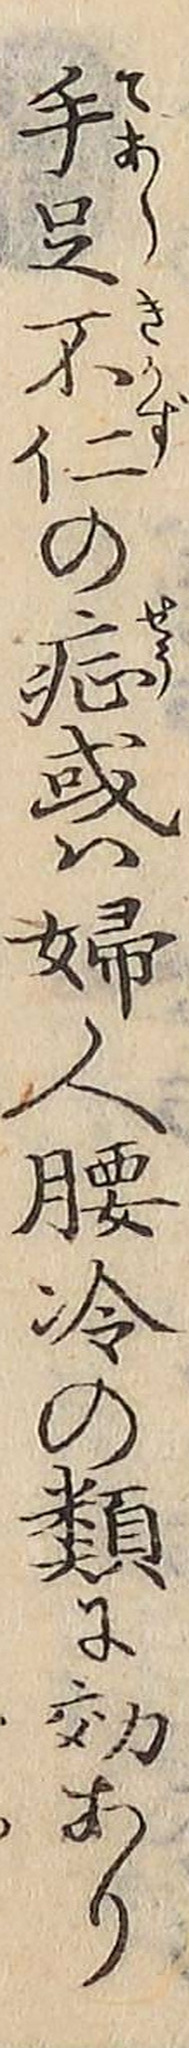手足不仁の症或は婦人腰冷の類に効あり
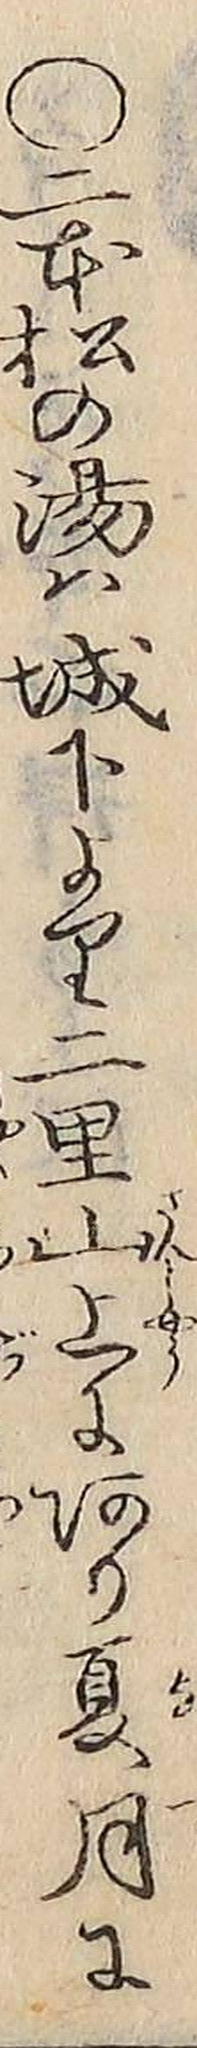○二本松の湯は城下より二里山上にあり夏月に
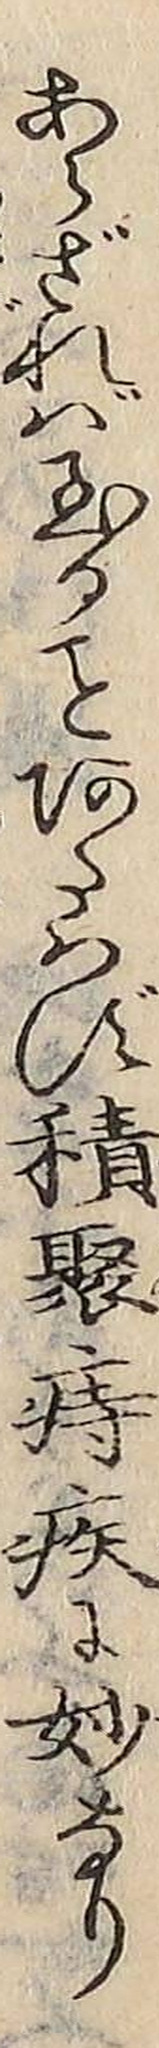あらざれば至ることあたはず積聚痔疾に妙なり
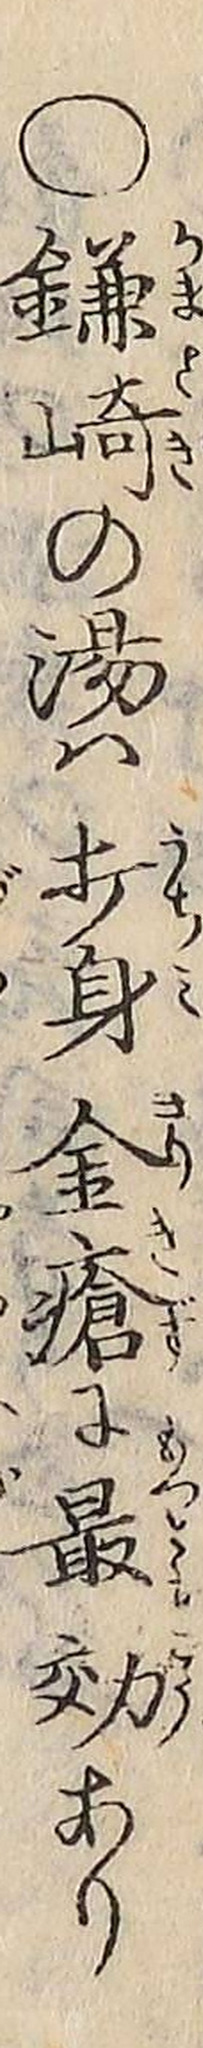○鎌崎の湯は打身金瘡に最効あり
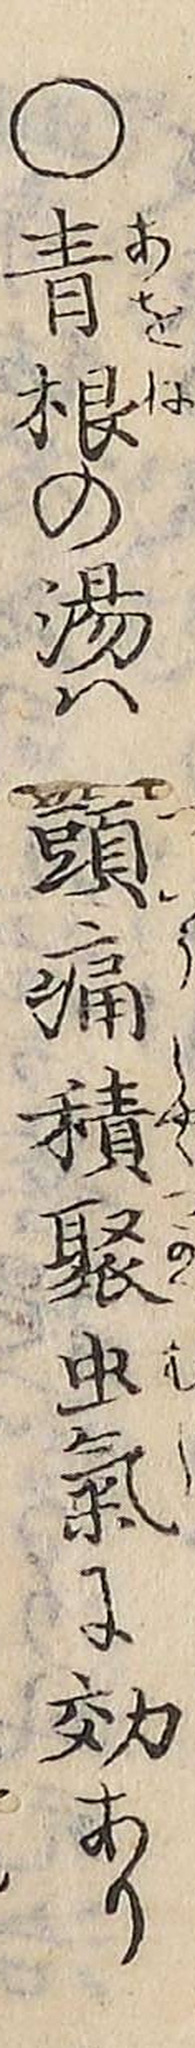○青根の湯は頭痛積聚虫気に効あり
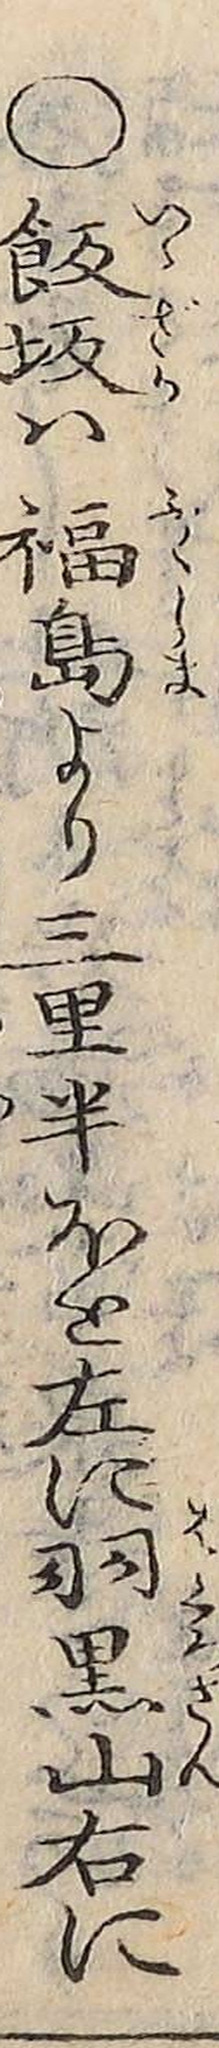○飯坂は福島より三里半ほと左に羽黒山右に
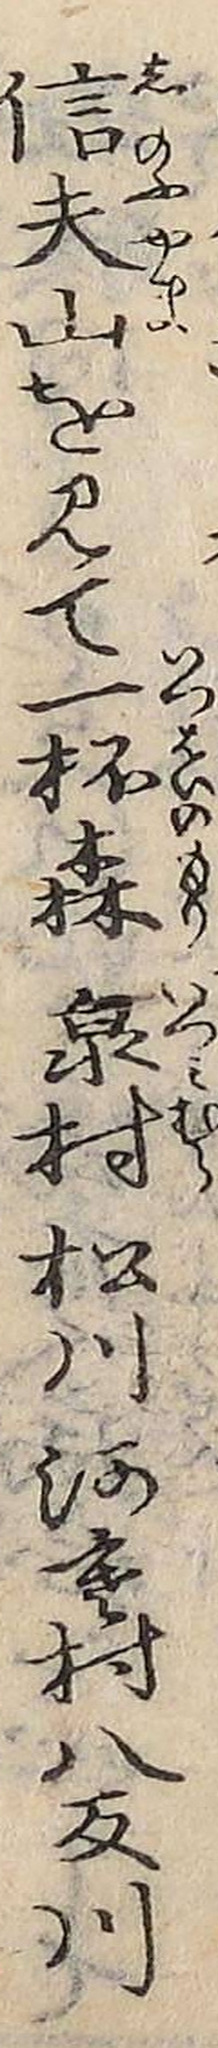信夫山を見て一杯泉村松川河寒村八反川
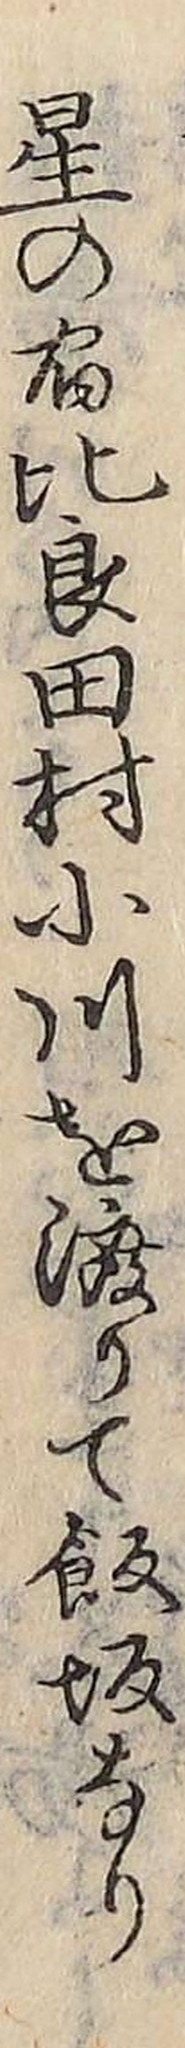星の宿比良田村小川を渡りて飯坂なり
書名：旅行用心集
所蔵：神戸大学附属図書館 国文学研究資料館
